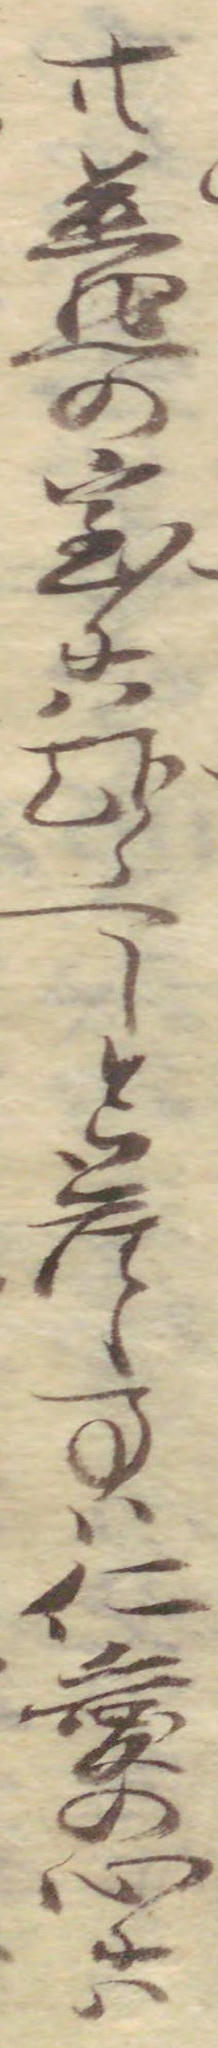共慈悲の室には赴くへしと御座候事は仁愛の心には
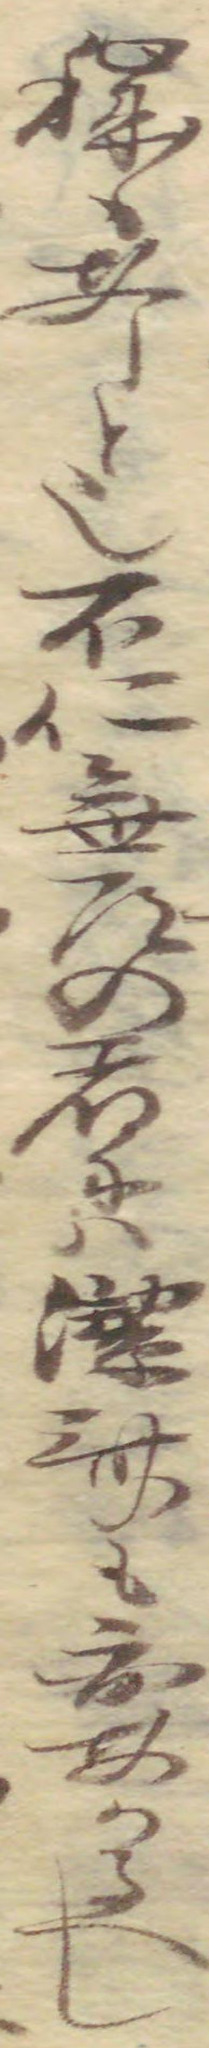穢もなしと也不仁無道の者には潔斎も亦なかるへし
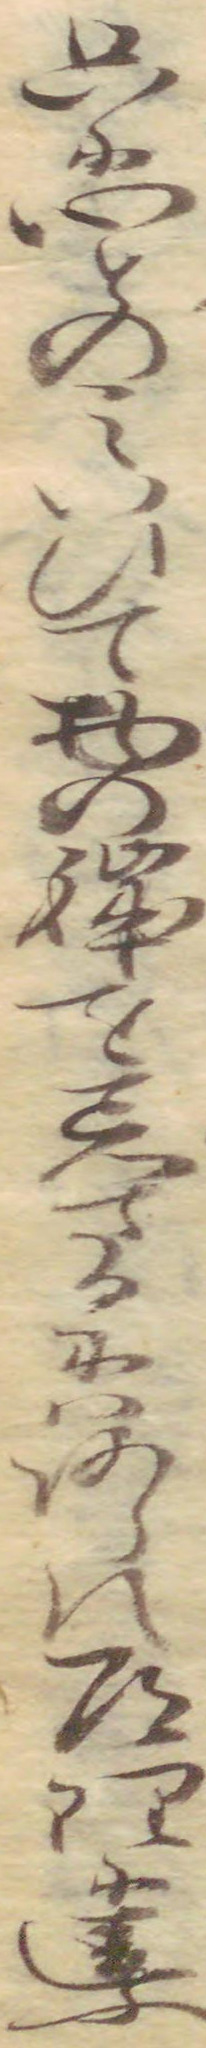只に心とのみいひて物の穢を忌さるにはあらす道理に違ふ

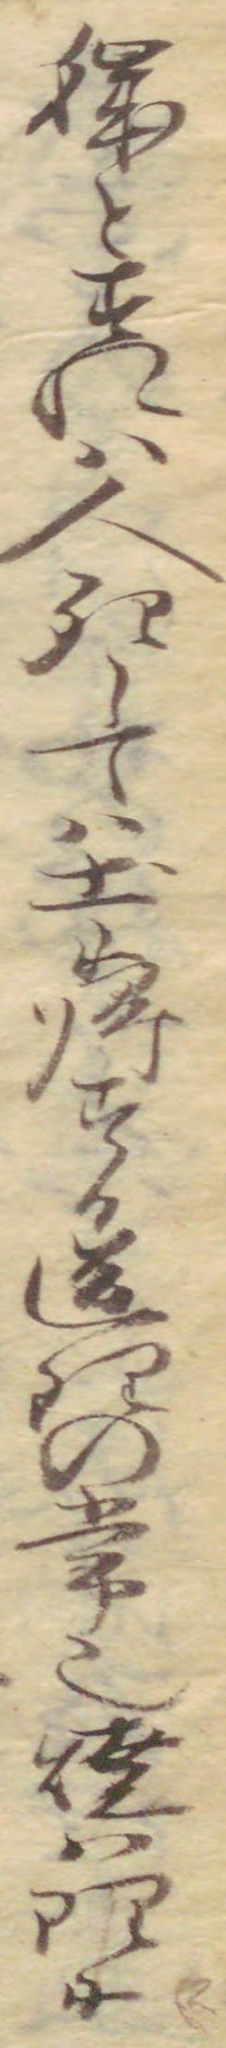穢とすれは人死しては土に帰する道理の常也焼は理に
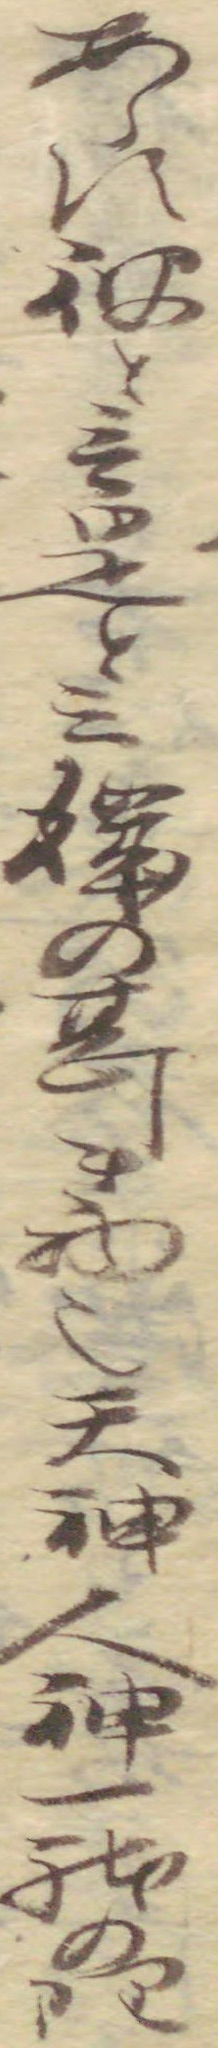あらす彼と言是と云穢の甚しき物也天神人神一体の理
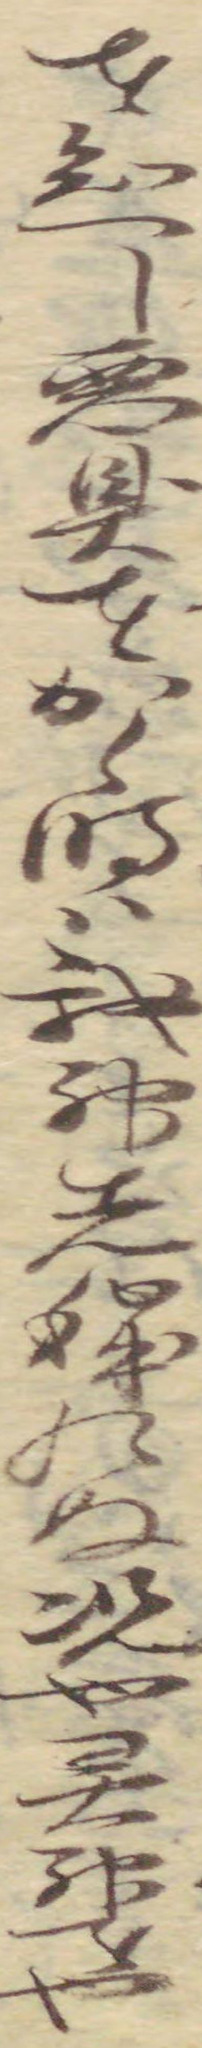を知へし悪臭をかく時は我神先穢れぬ況や霊神をや
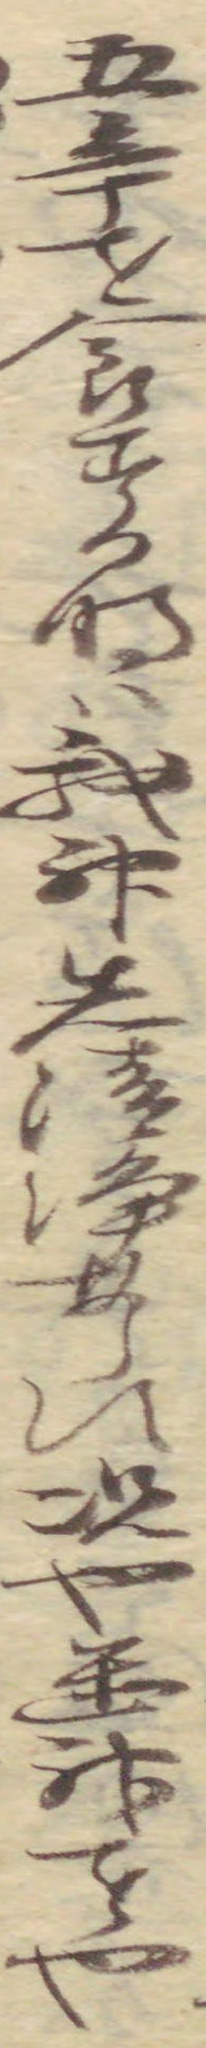五辛を食する時は我神先清浄ならす況や迷神をや
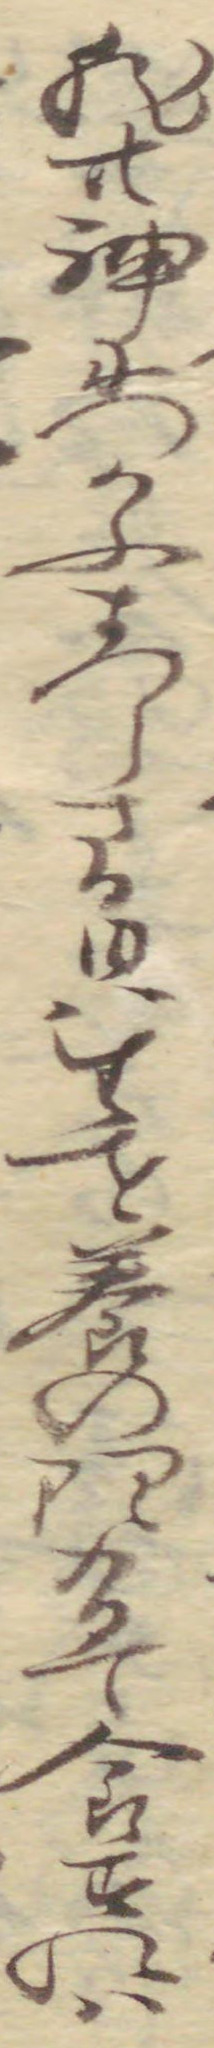然共神につかふまつらさる日は生を養の理有て食すれは
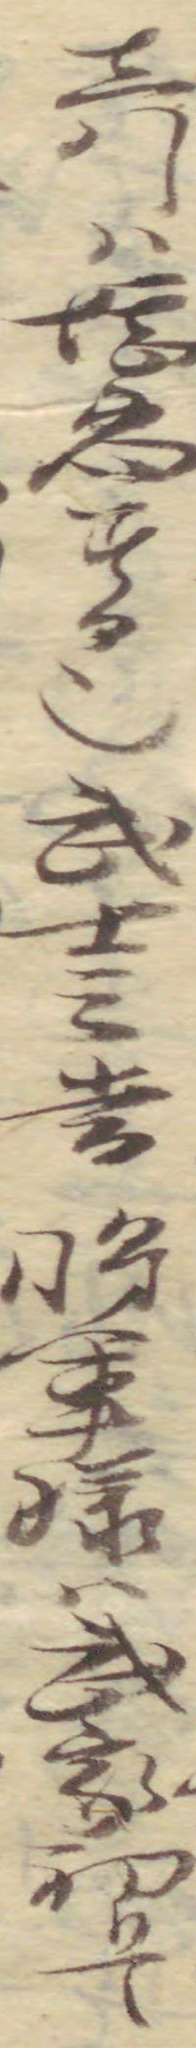しはしは堪忍する也武士云当将軍様は武家初りて
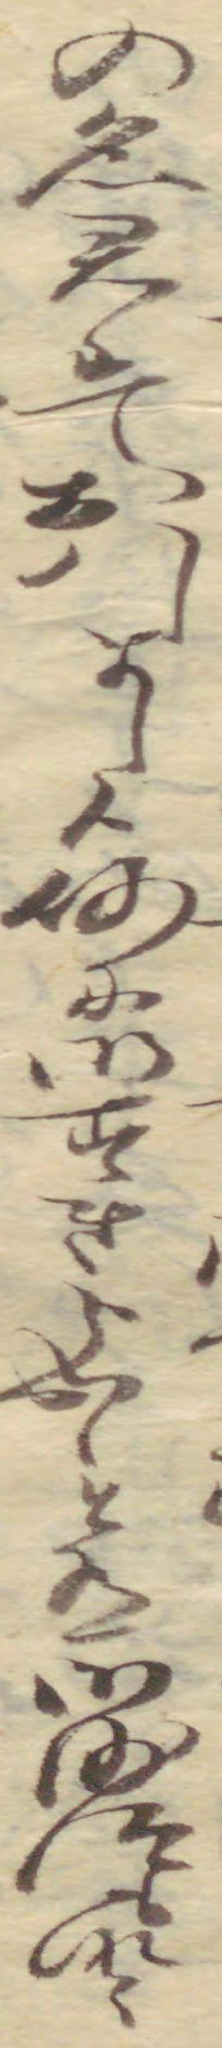の名君にておはしまし候何に御すき被成候と有御沙汰もなく
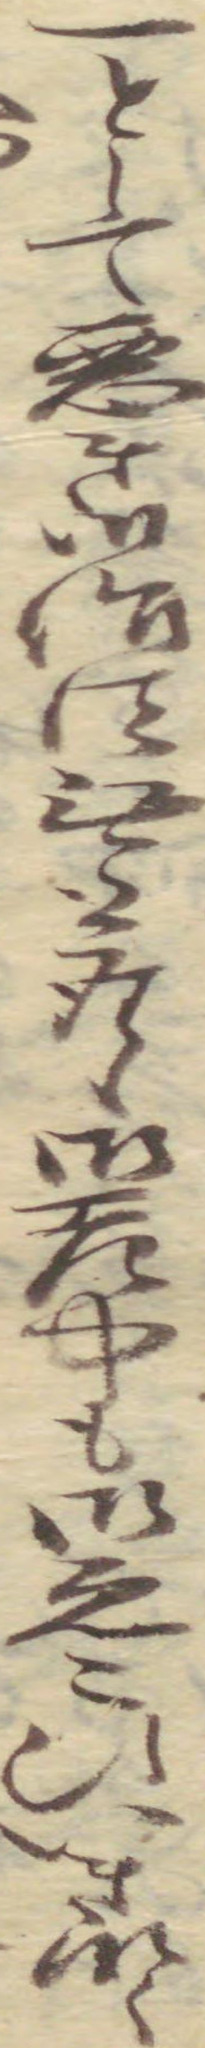一として悪き御作法無御座候御老中も御ゑこひいきなく
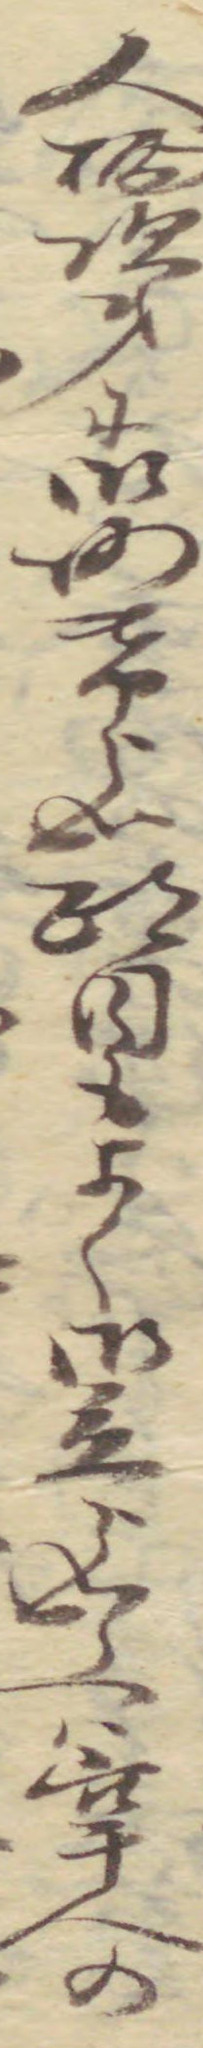人柄次第に御あけ被成跡目もよく御立被成候へは牢人の
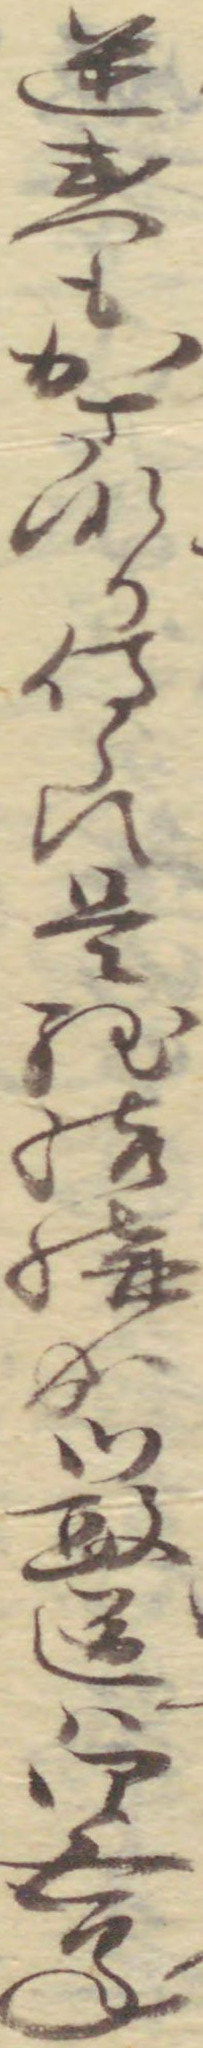迷惑もかさなり侍らす是程結構成御政道は四五百年
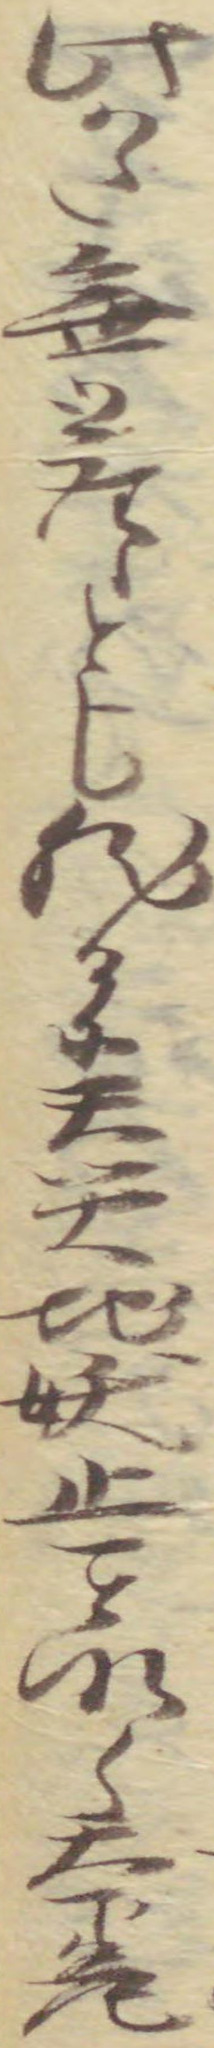此かた無御座候と申候然るに天災地妖止ことなく天下危
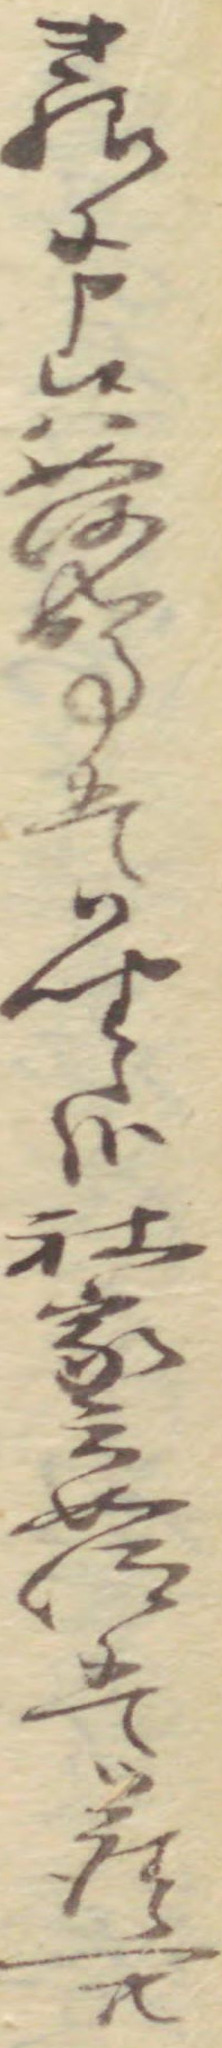き様に申候は如何成事にて御座候哉社家云如仰にて御座候へ共
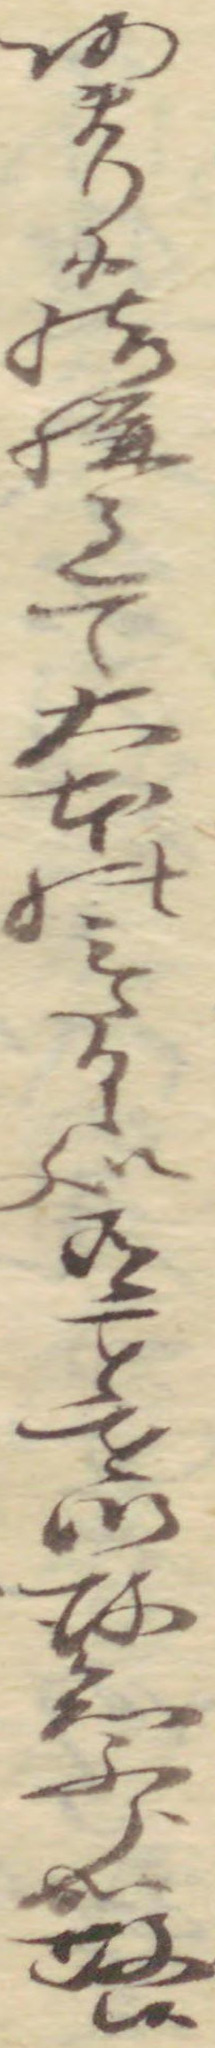あまりに結構過て大本のみたるゝ処有ことを御存知不被成故候
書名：鶯宿雑記. 巻263-264
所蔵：国立国会図書館 National Diet Library, JAPAN
